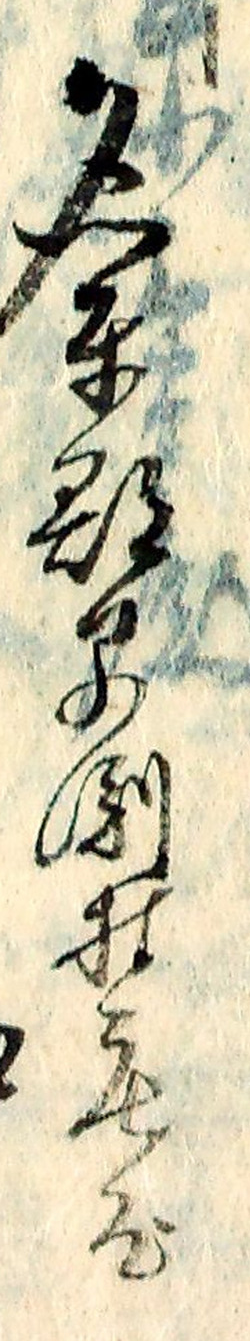名東郡早淵村庄屋
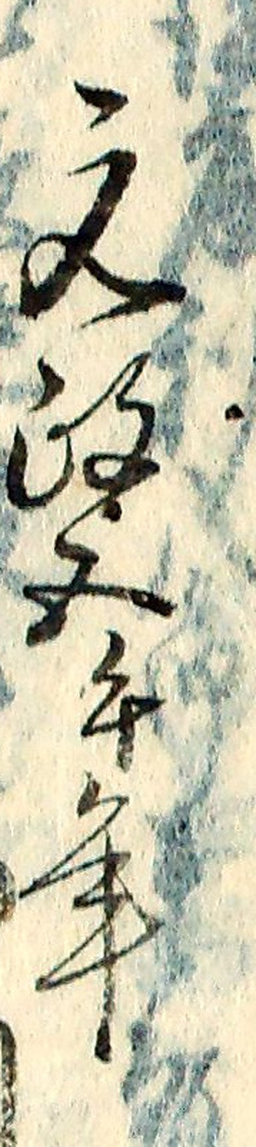文政五午年
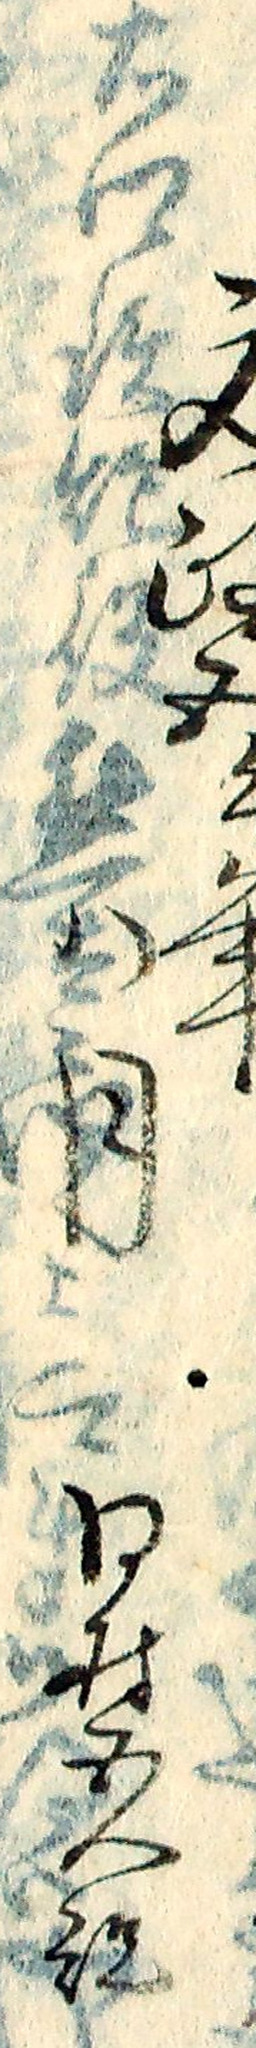八月同村五人組
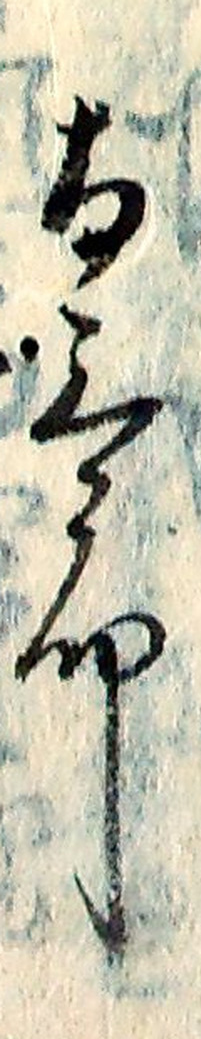与三郎
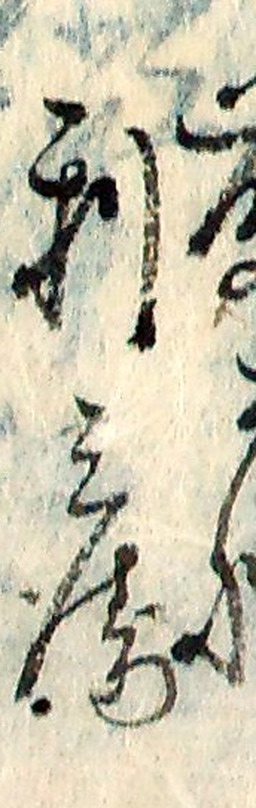利兵衛

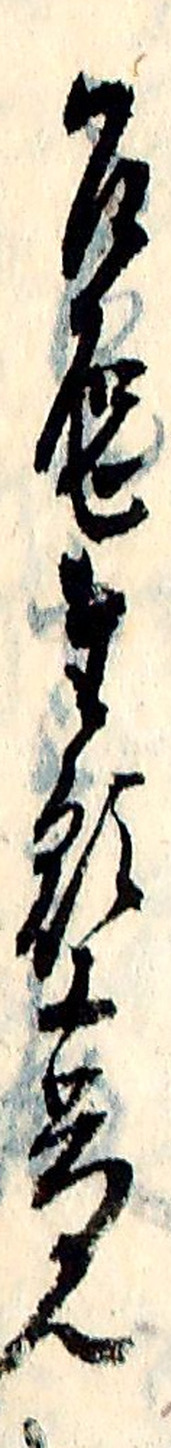乍恐奉願上覚
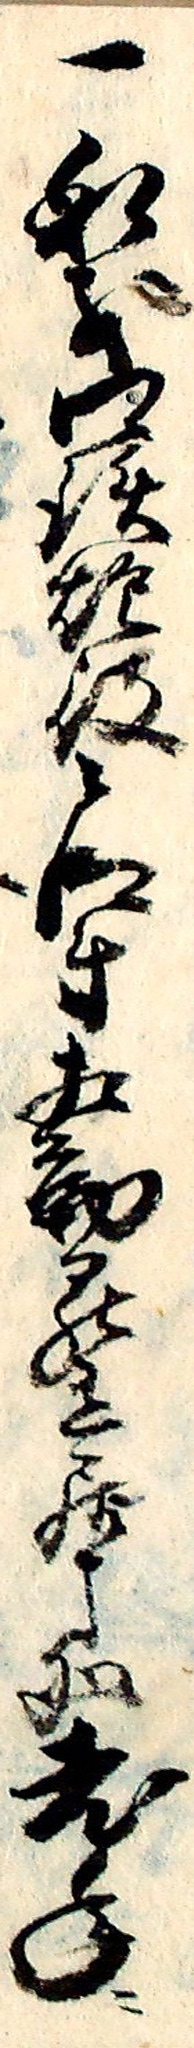一私義郷鉄炮役被仰付相勤罷有居申候処老年に
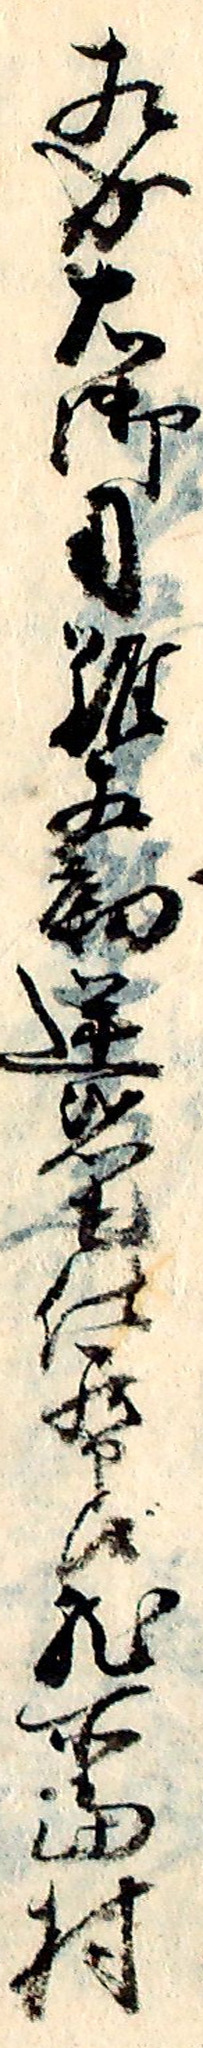相成右御用難相勤迷惑奉仕居申候然所当村
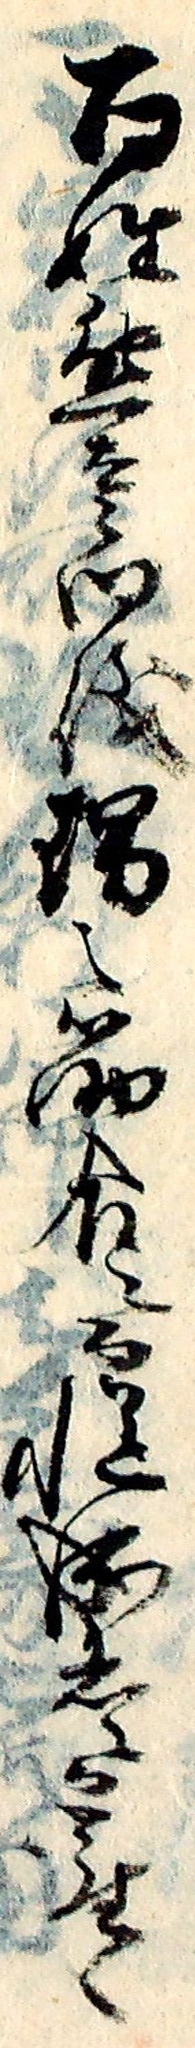百姓熊太郎儀端之筋合にて慥成者にて御座候
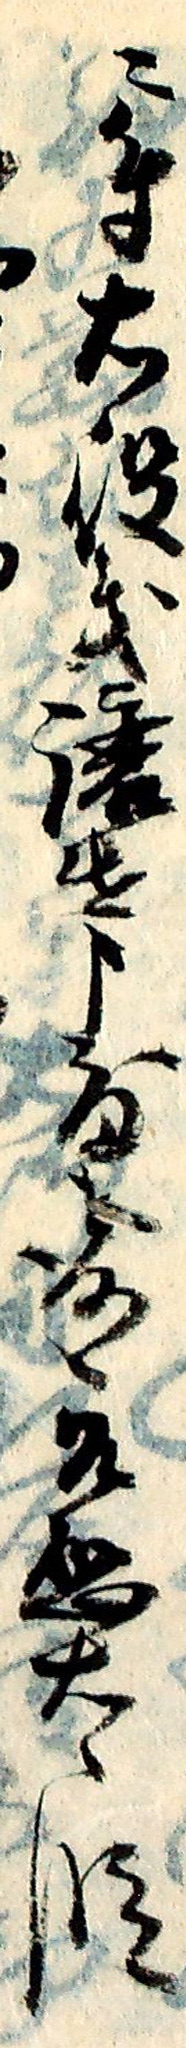に付右役義譲遣申度奉存候乍恐右之段
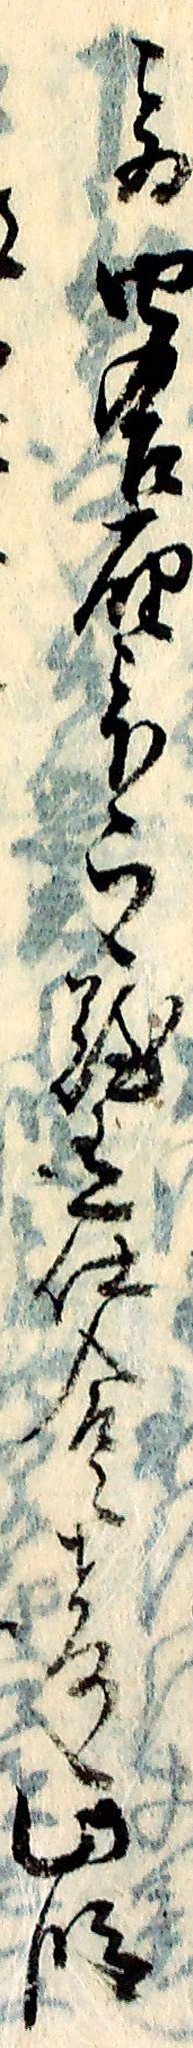被為聞召届被下候はゝ難有仕合に奉存候此段
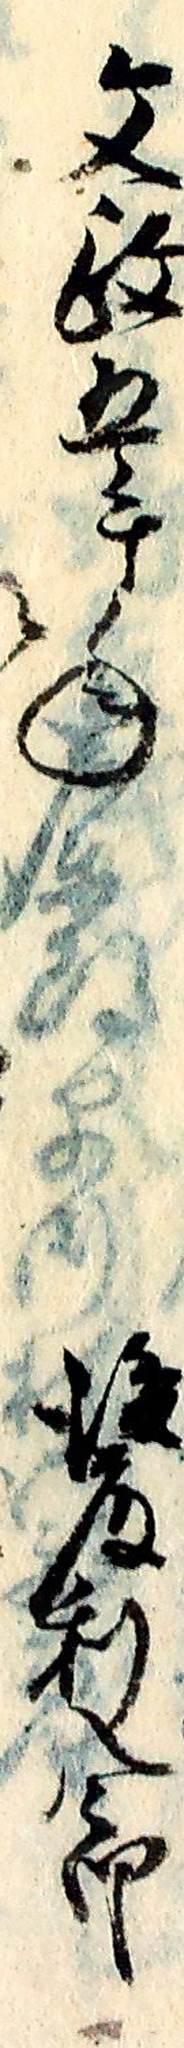文政五午年後藤利八郎
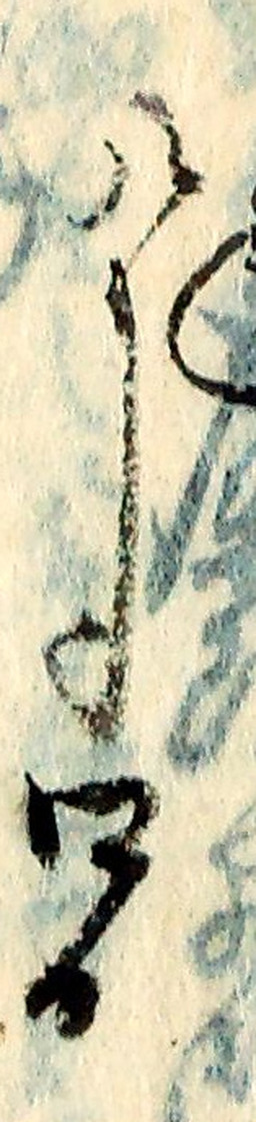八月四日
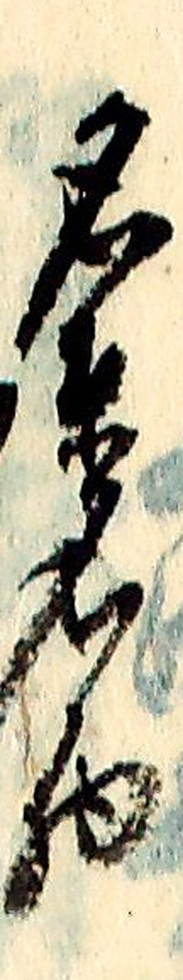名東名西
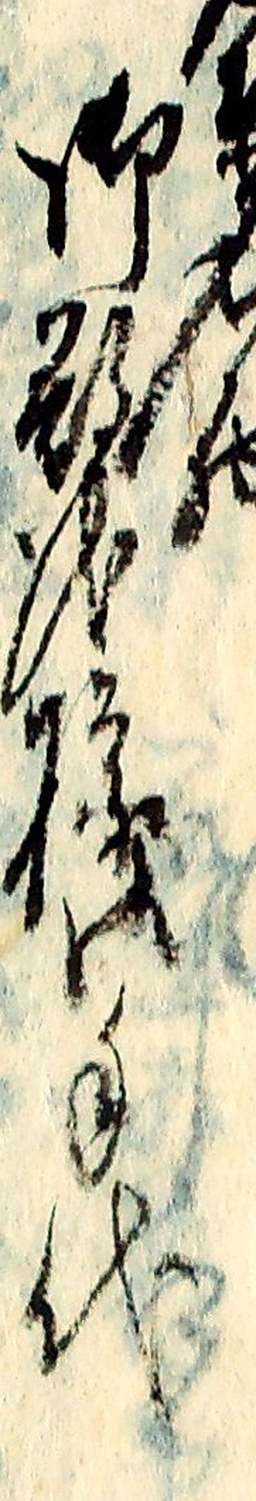御郡代様御手代
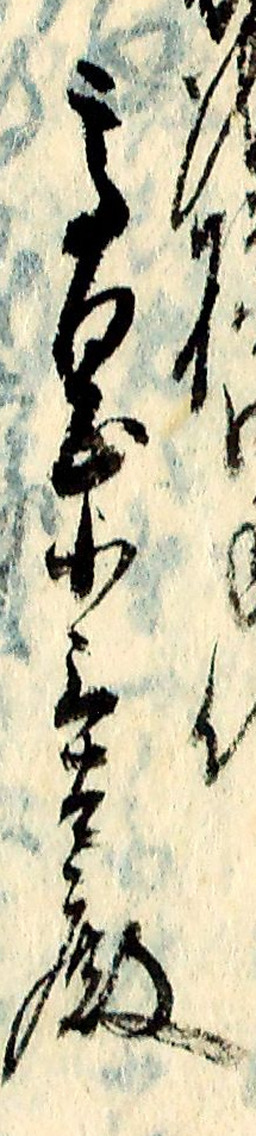高岡小三太殿
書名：諸御願書控(後藤氏壱番）
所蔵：鳴門教育大学 Naruto University of Education
